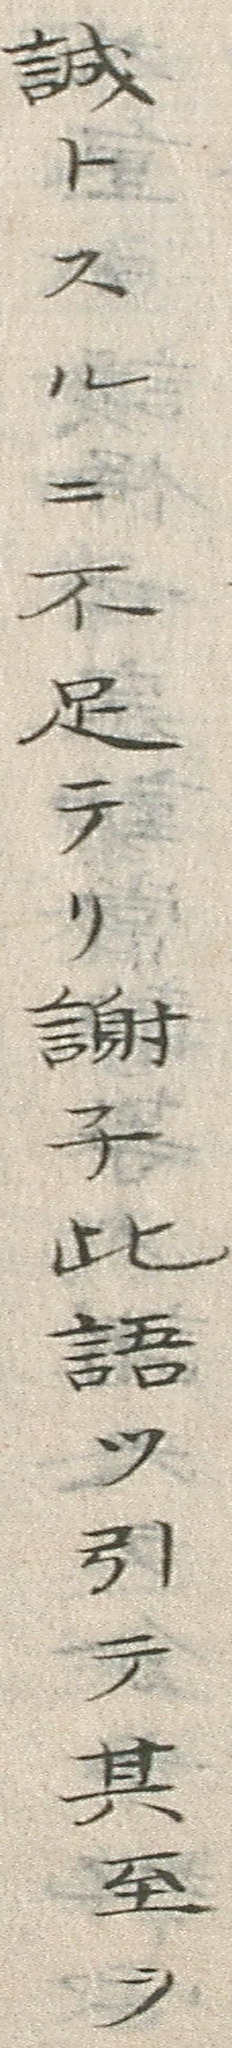誠トスルニ不足テリ謝子此語ッ引テ其至ヲ
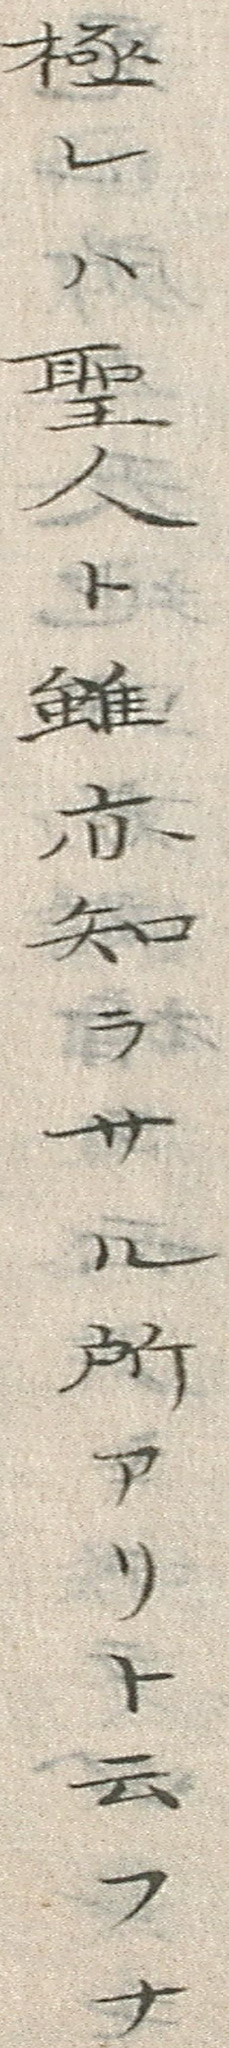極レハ聖人ト雖亦知ラサル所アリト云フナ
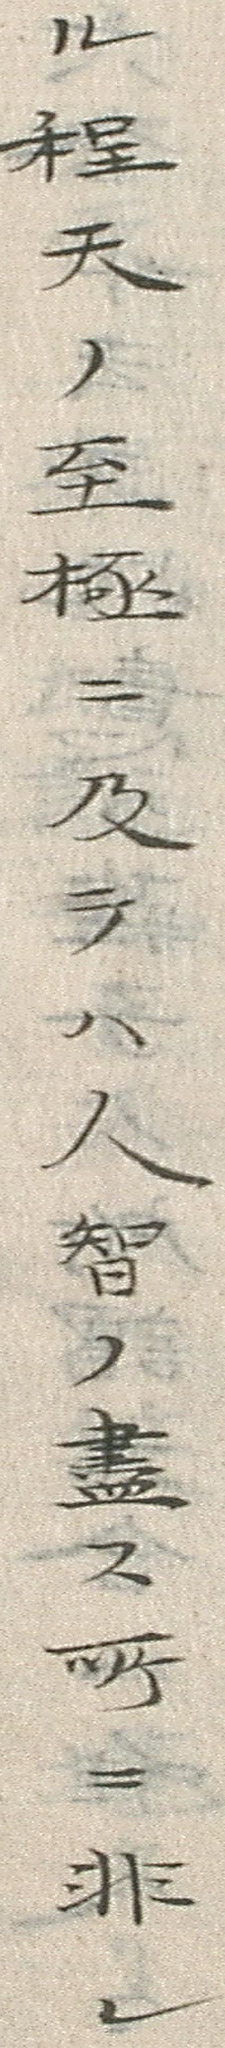ル程天ノ至極ニ及テハ人智ノ尽ス所ニ非レ
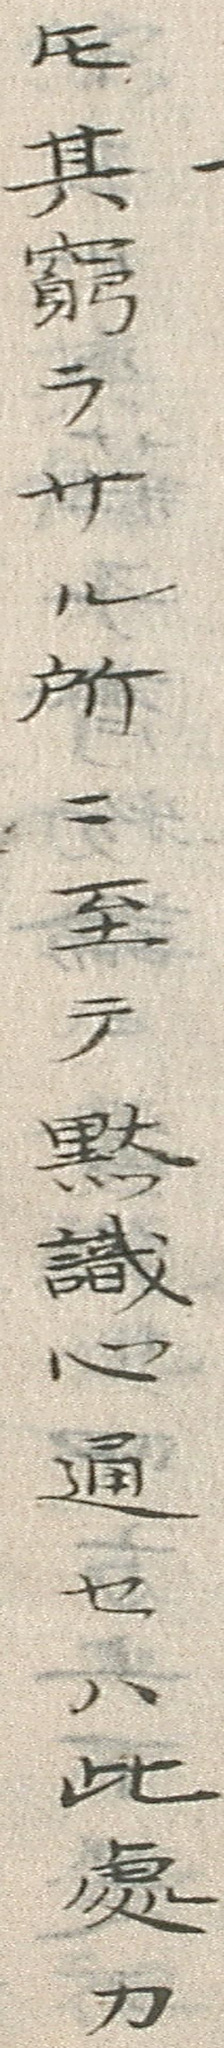トモ其窮ラサル所ニ至テ黙識心通セハ此処カ
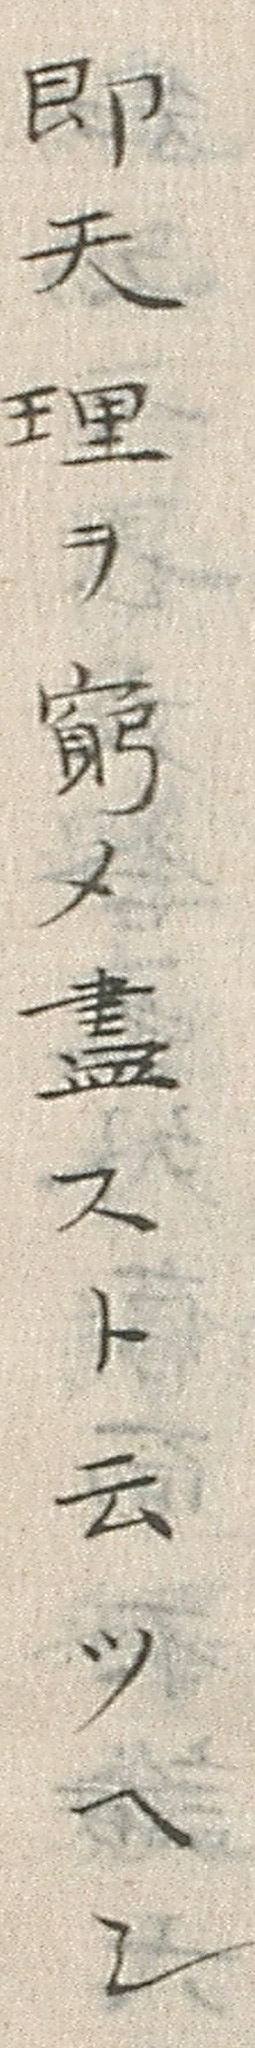即天理ヲ窮メ尽スト云ツヘシ
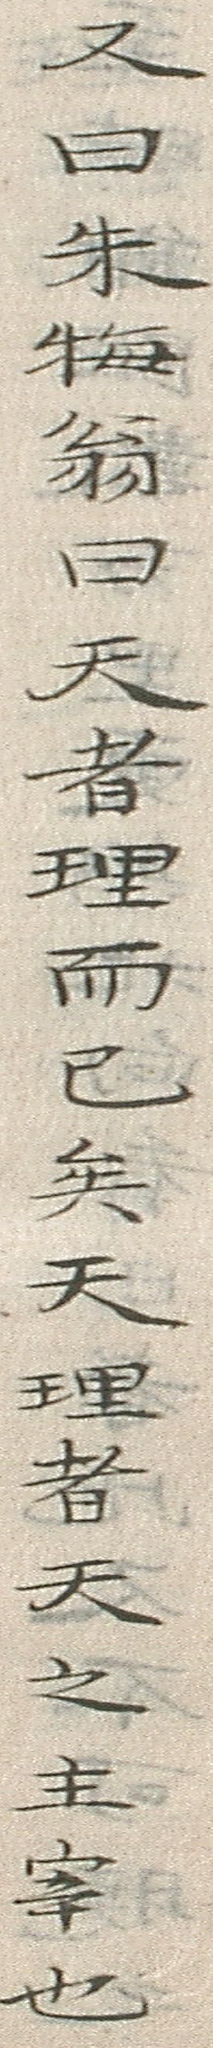又曰朱梅翁曰天者理而已矣天理者天之主宰也
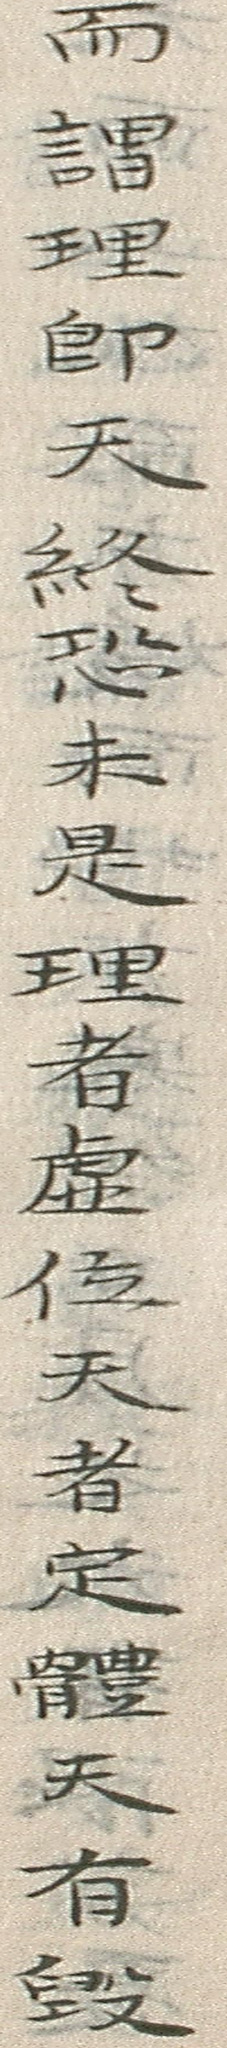而謂理郎天終恐未是理者虚位天者足体天有毀
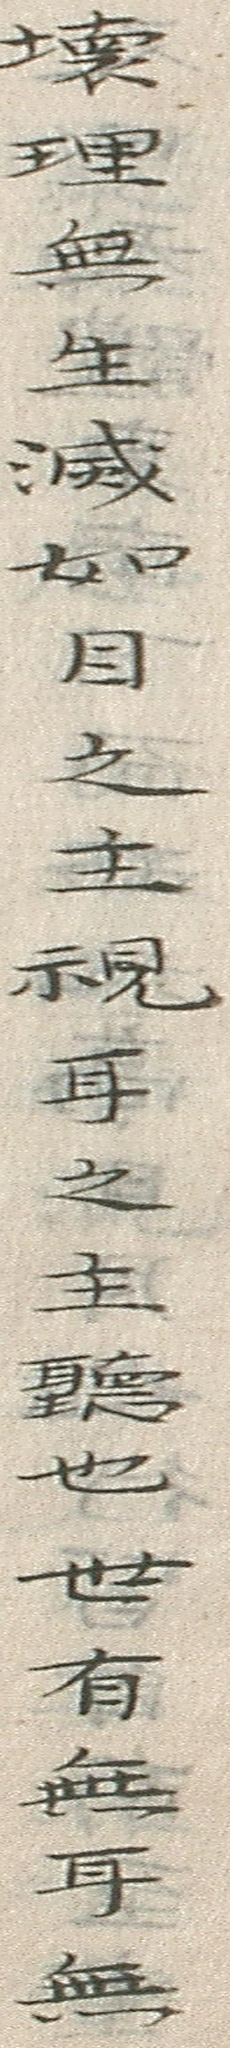壊理無生滅如目之主視耳之主聴也世有無耳無
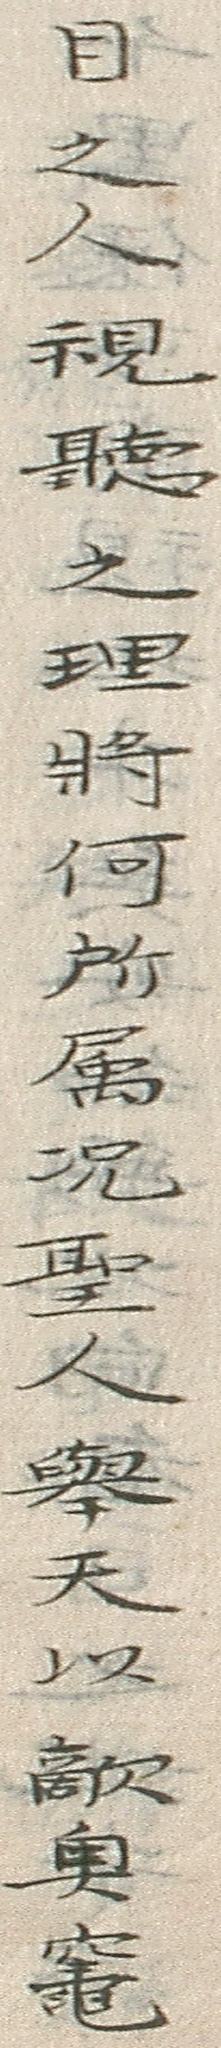目之人視聴之理将何所属况聖人擧天以敵奥竈
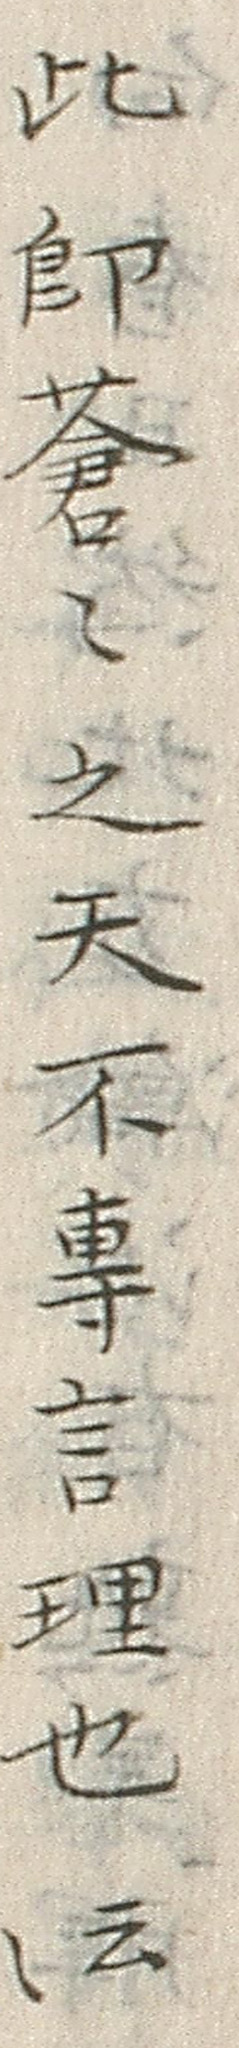此郎蒼〻之天不専言理也云〻
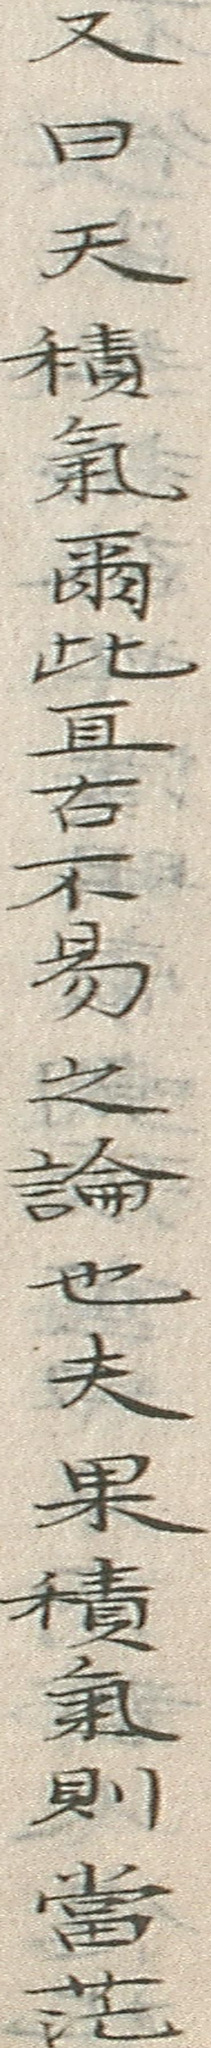又曰天積気爾此亘古不易之論也夫果積気則当茫
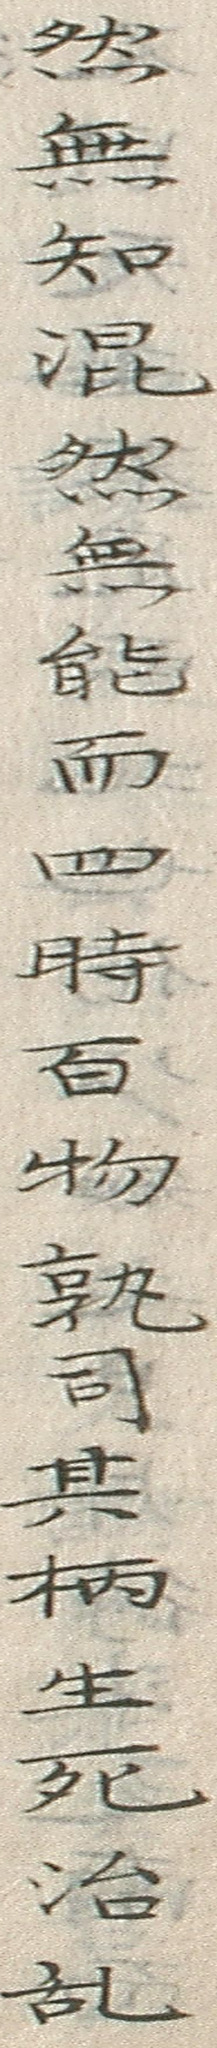然無知混然無能而四時百物孰司其柄生死治乱
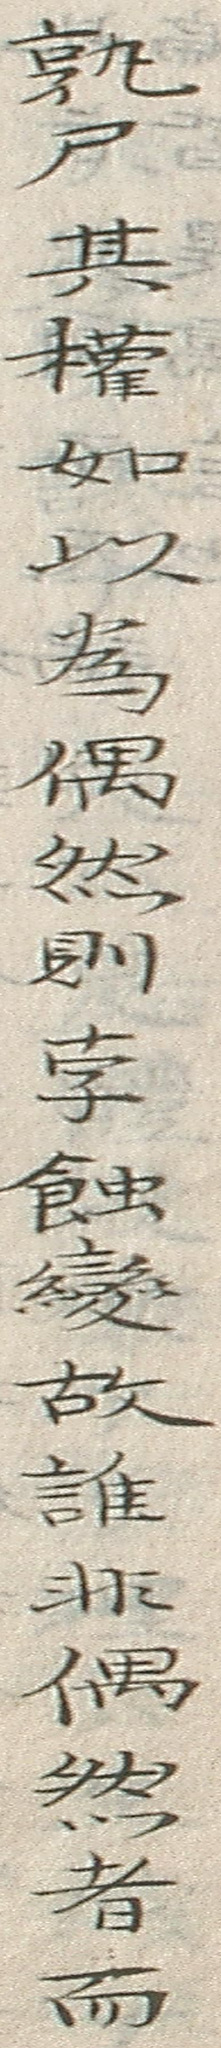孰尸其権如以為偶然則孛蝕変故誰非偶然者而
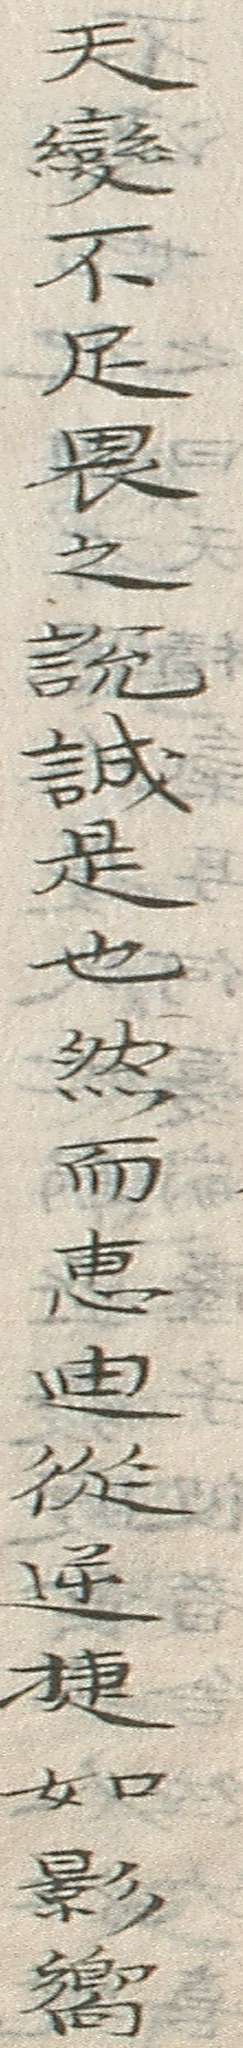天変不足畏之説誠是也然而恵廸従逆捷如影嚮
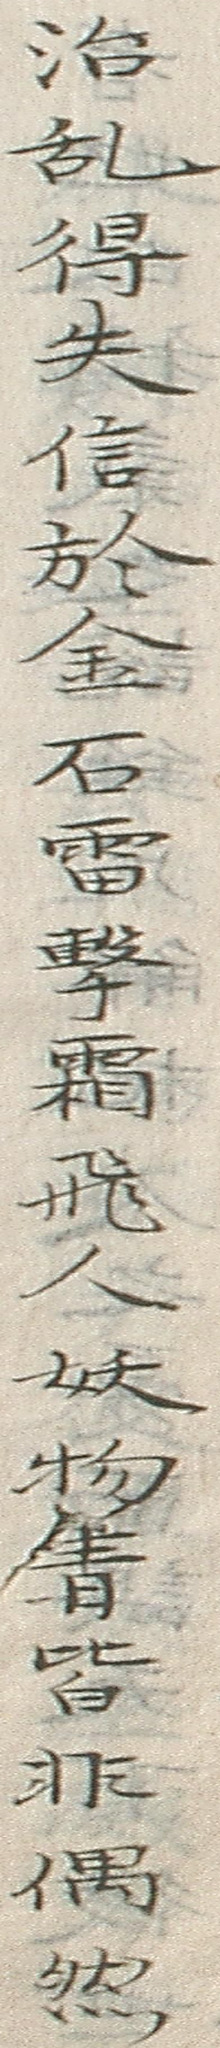治乱得失信於金石雷撃霜飛人妖物眚皆非偶然

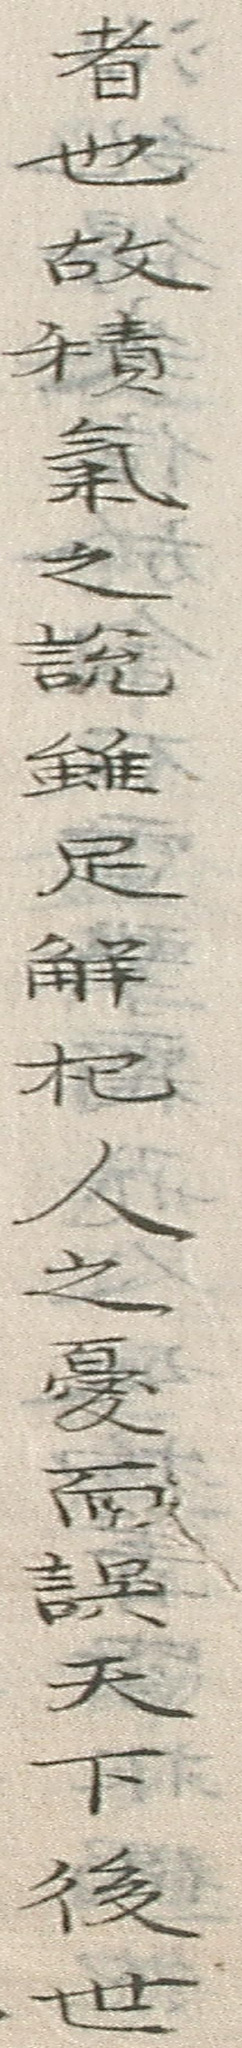者也故積気之説雖足觧杞人之憂而誤天下後世
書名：天學略名目羽翼　全
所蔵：東京大学地震研究所図書室 Earthquake Research Institute Library, The University of Tokyo, JAPAN
